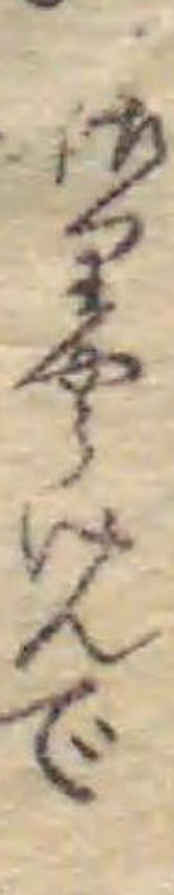御りやうけんで
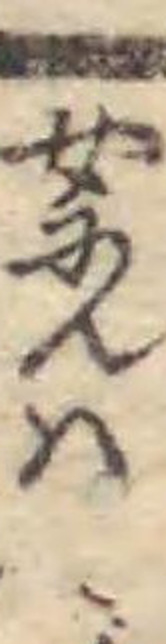女にんは
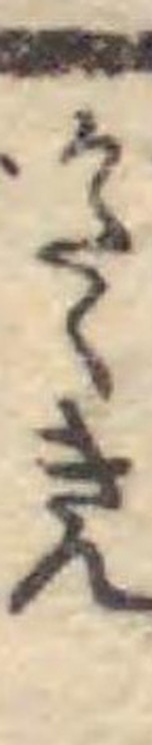かたくきん
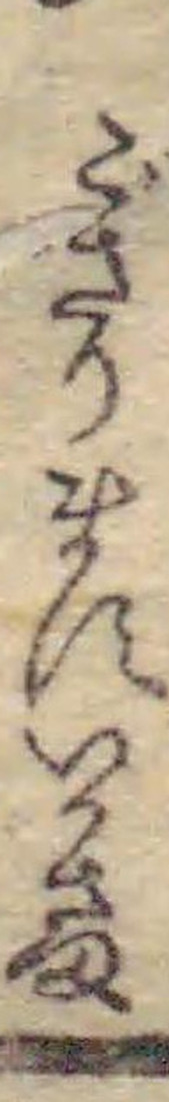ごさりますいかさま
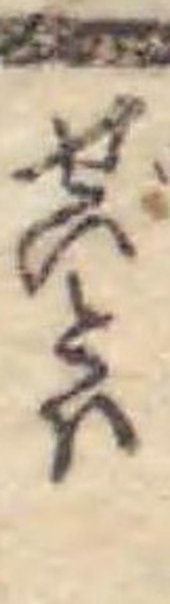ぜいとは
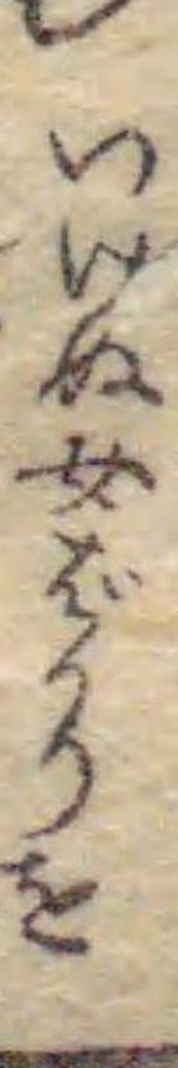いけぬ女ばかりを
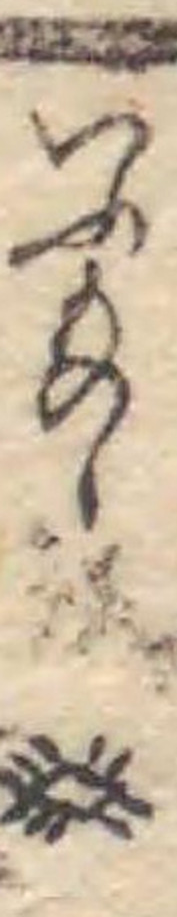いふものゝ
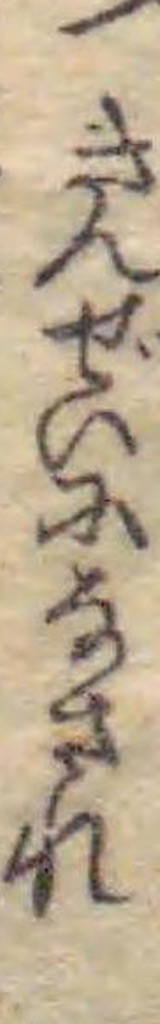きんぜいになされ
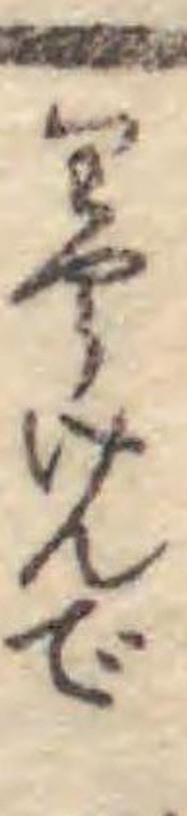りやうけんで
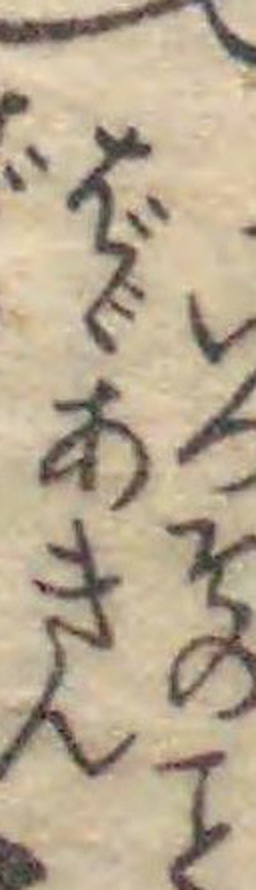ばゝあきん
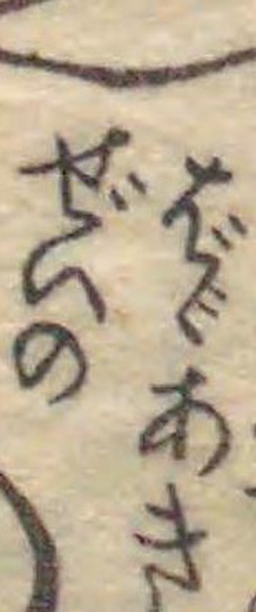ぜいの
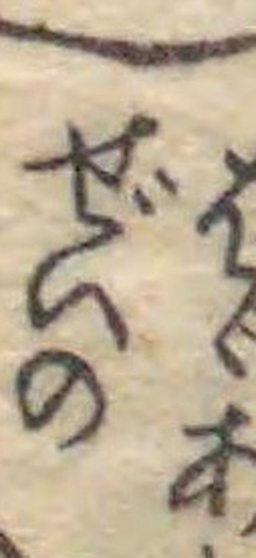ぜいの
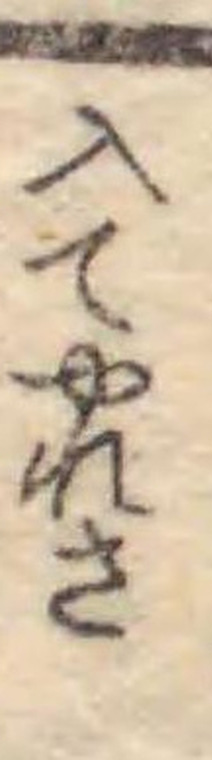入てやれさ
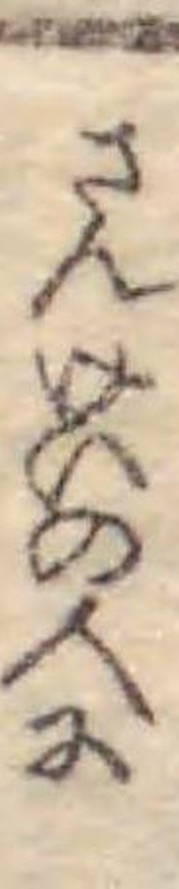さんけいの人に
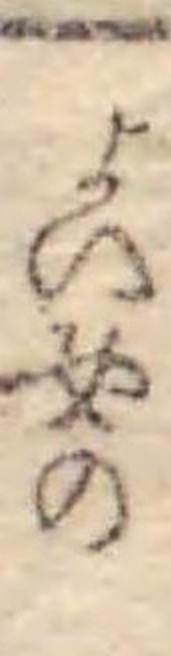よい女の
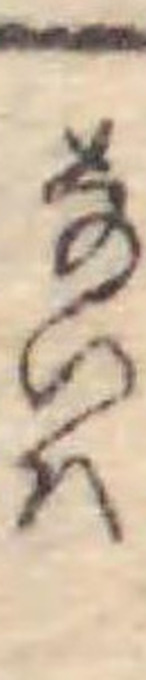ないは
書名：鐘入七人化粧 : 3巻
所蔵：国立国会図書館 National Diet Library, JAPAN
